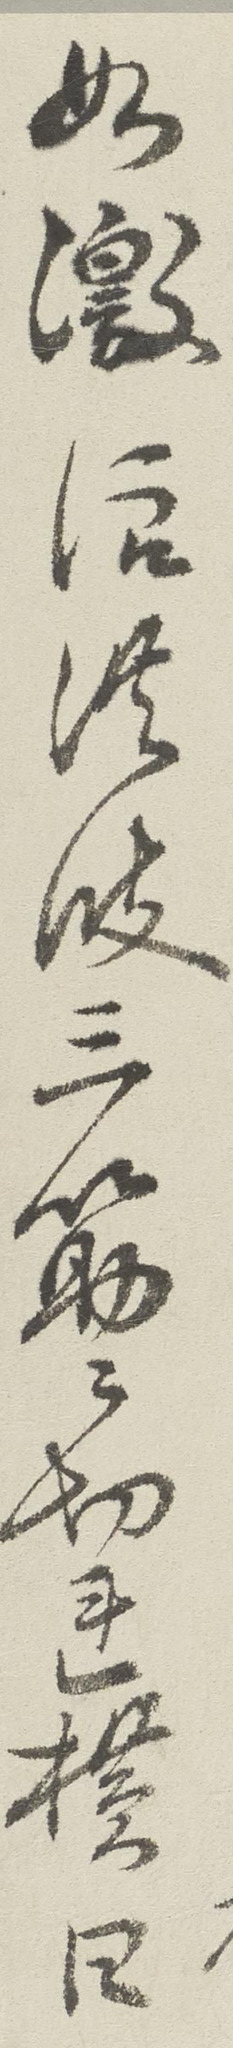如激浪洪波三筋ニ切れ横凡
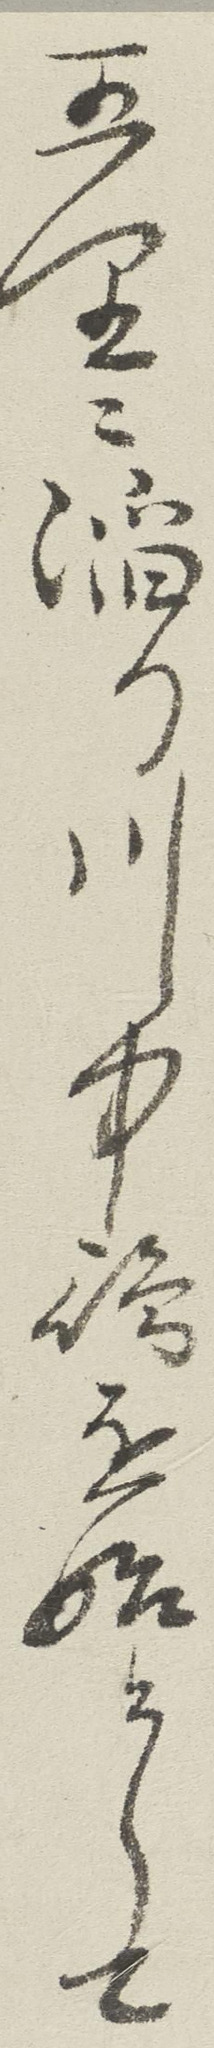五里ニ㴞り川中嶋を始として
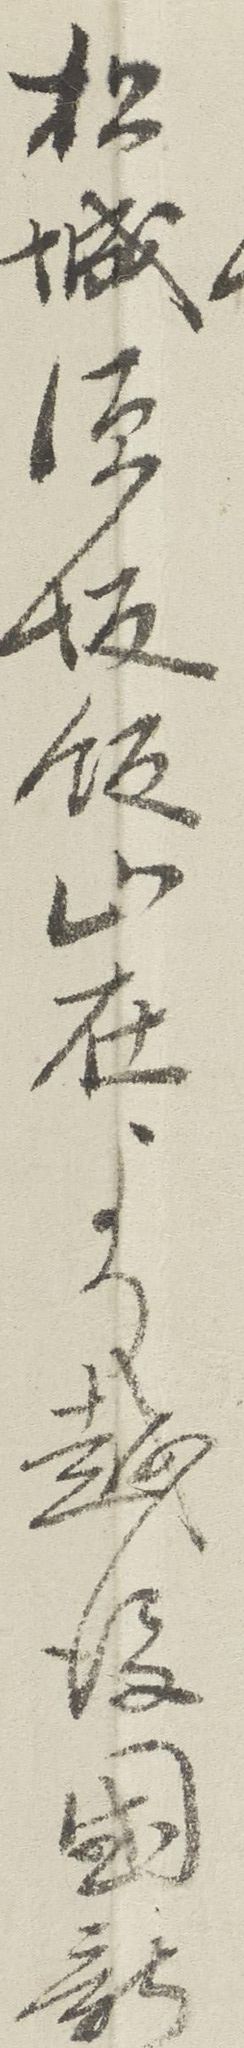松城須坂飯山在より越後国新

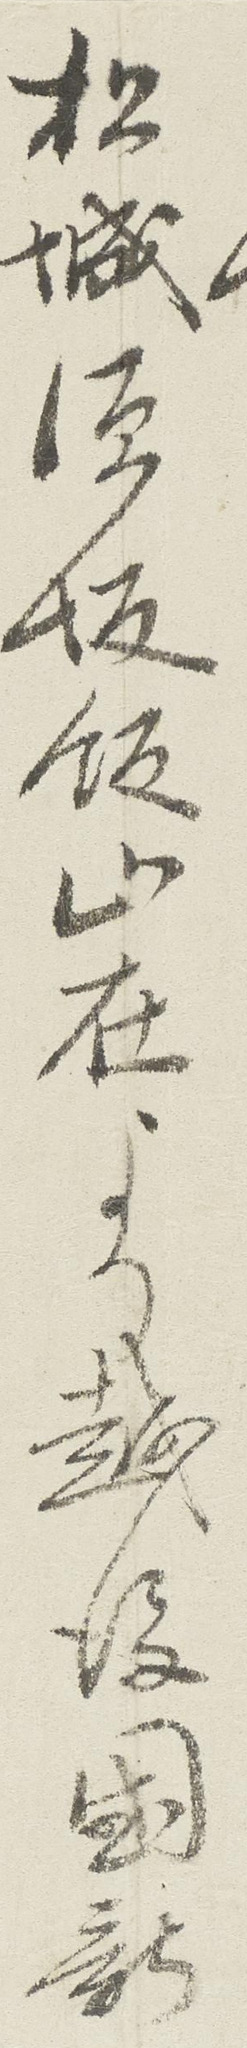松城須坂飯山在より越後国新
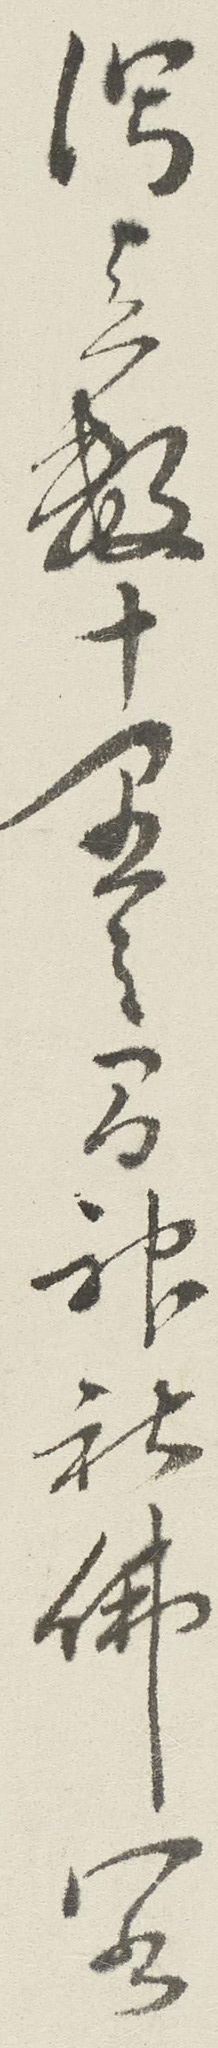潟迄数十里之間神社仏閣
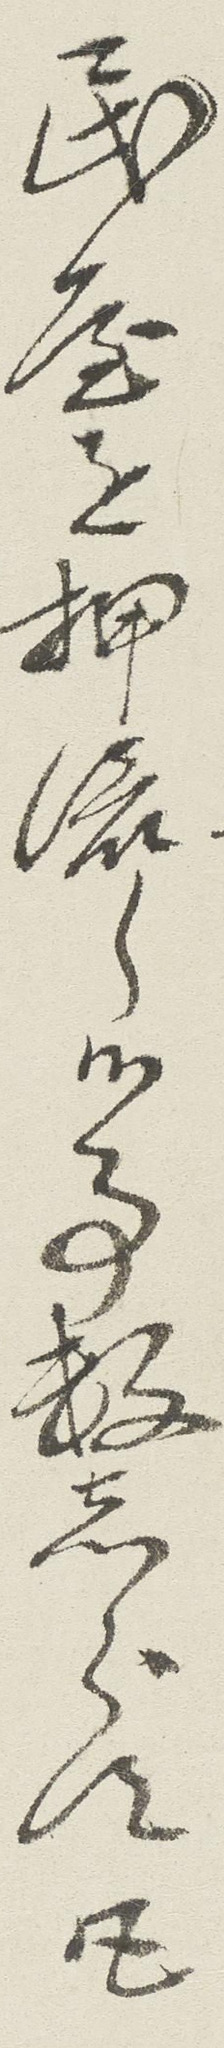民屋を押流し候事数しらす凡
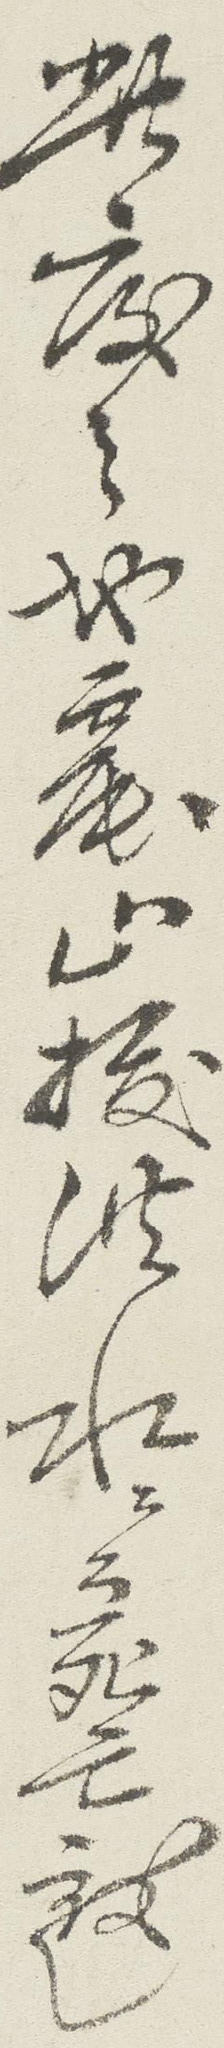此度之地震山抜洪水二而死亡致し
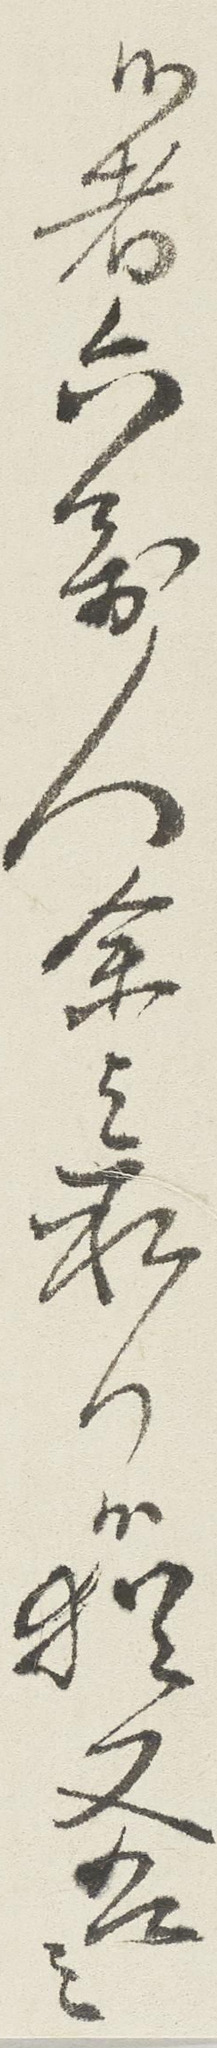候者六万人余と承り候猶又右之
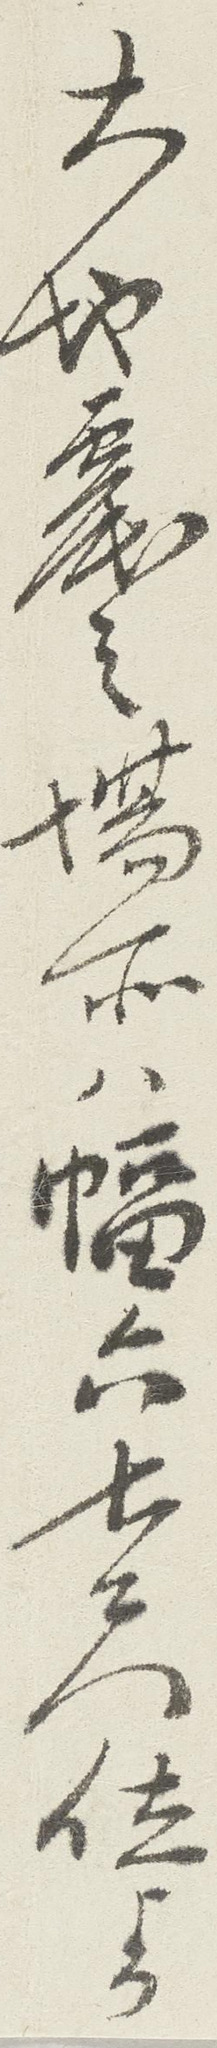大地震之場所は幅六七尺位より
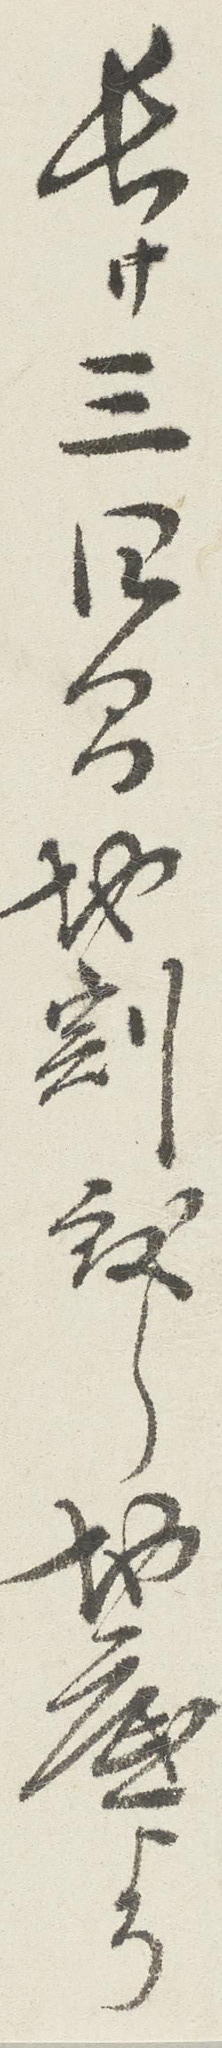長サ三四間地割致し地底より
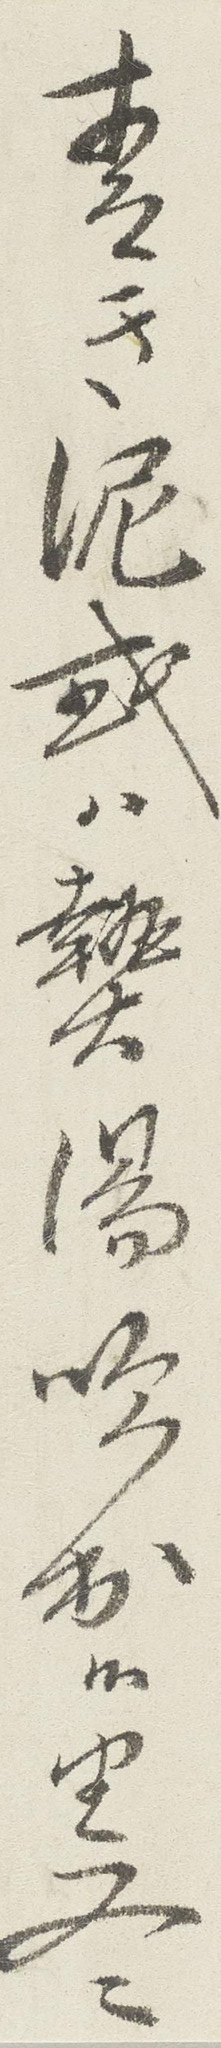青き泥或は熱湯吹出候由又々
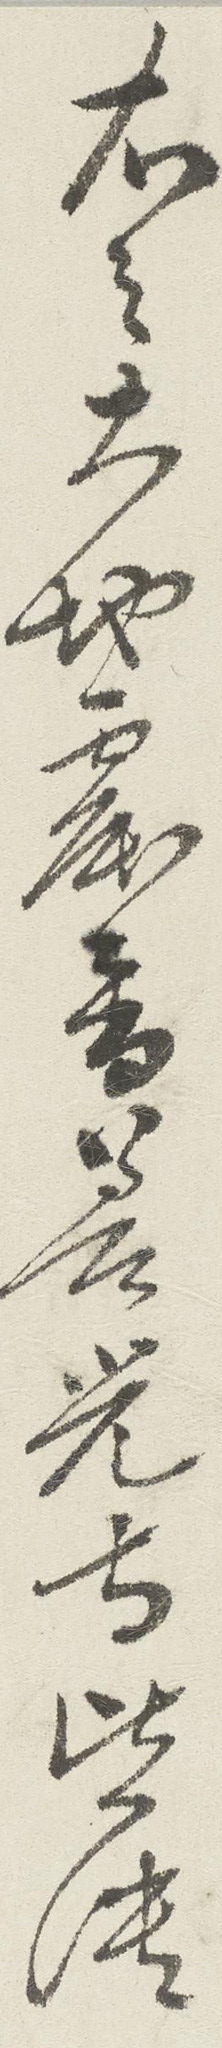右之大地震二而善光寺皆潰
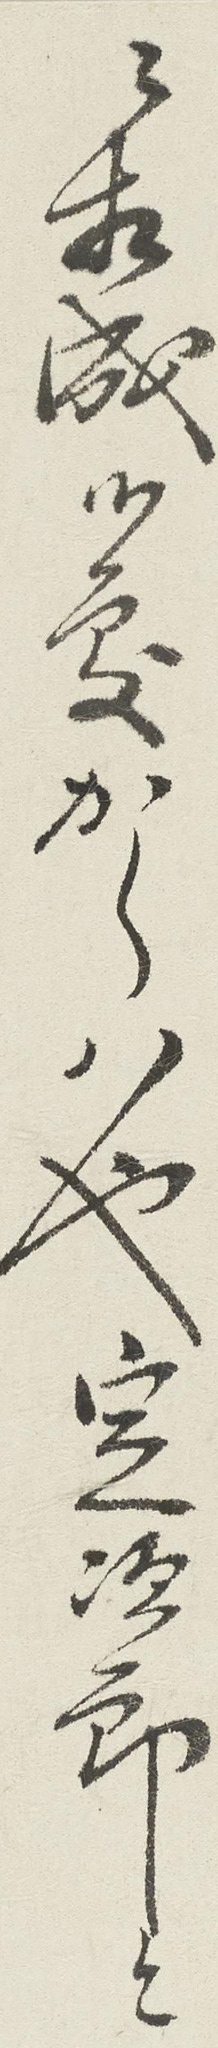ニ相成候処かしはや定次郎と
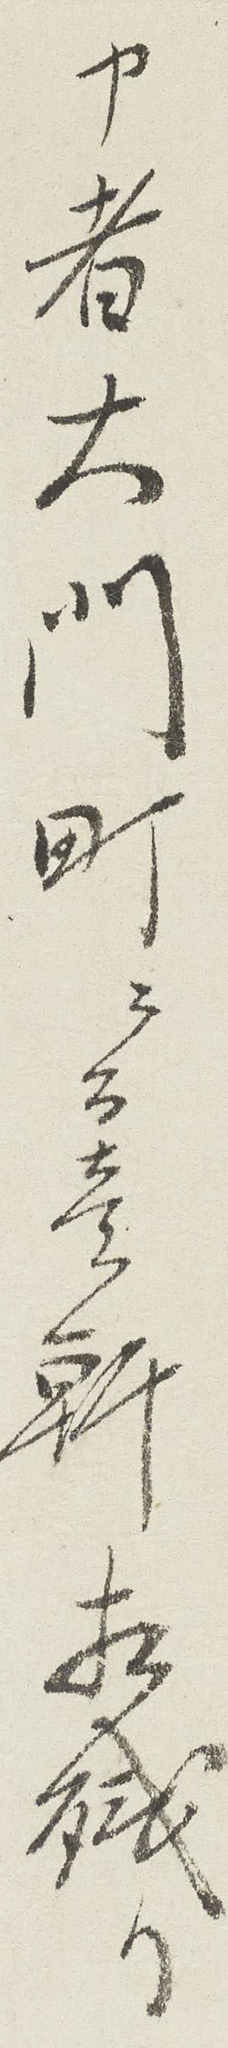申者大門町二而壱軒相残り
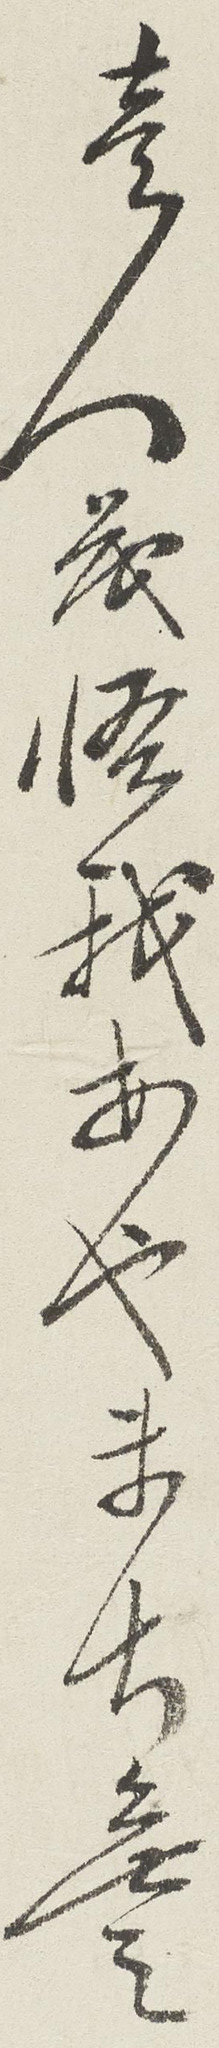壱人も怪我あやまち無之
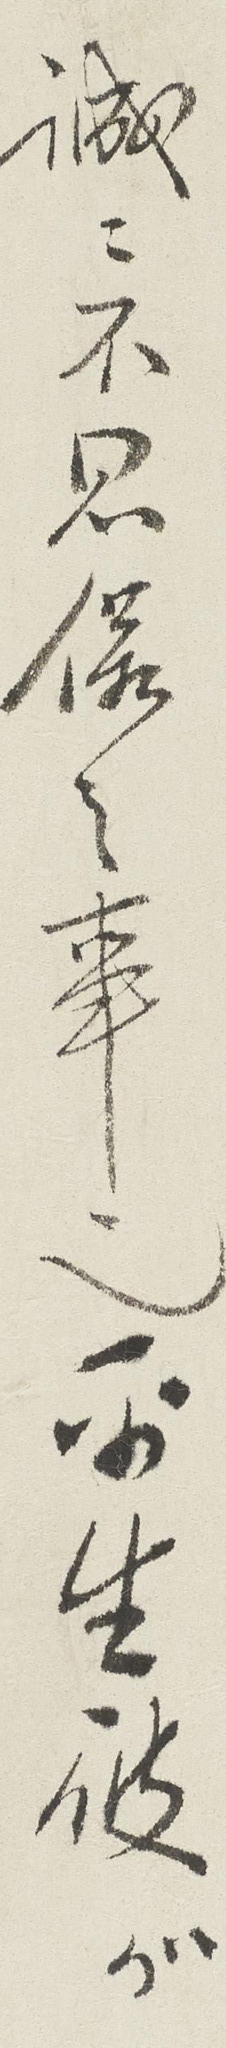誠ニ不思儀之事也平生彼が
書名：[善光寺地震に関する書状]
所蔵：東京大学地震研究所図書室 Earthquake Research Institute Library, The University of Tokyo, JAPAN
